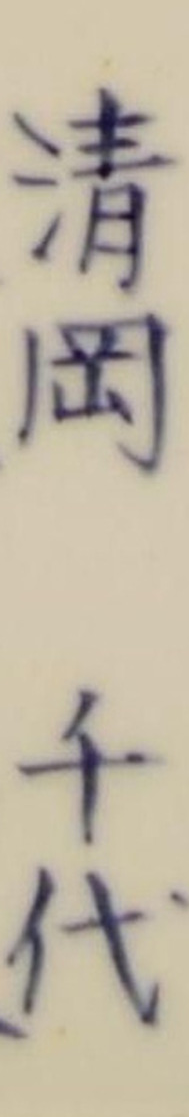清岡千代
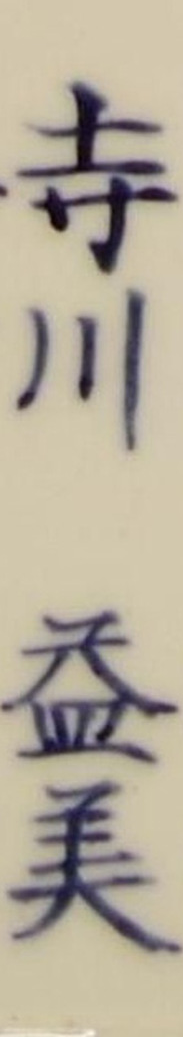寺川益美
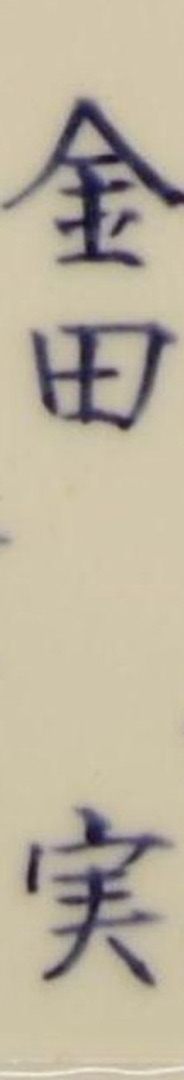金田実
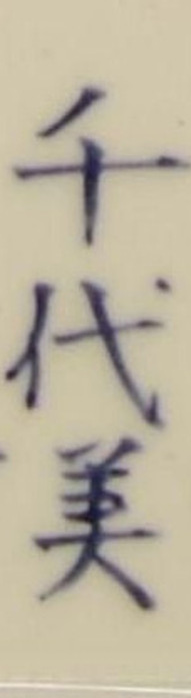千代美
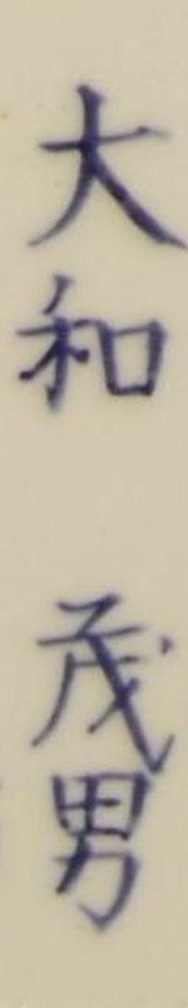大和茂男
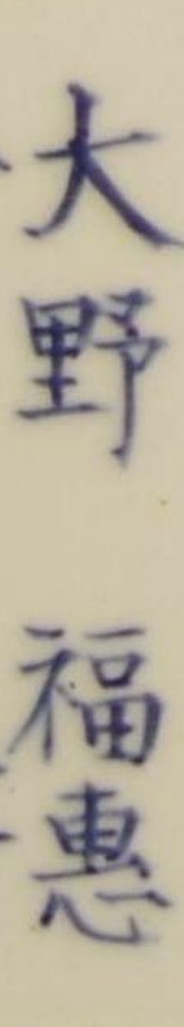大野福恵
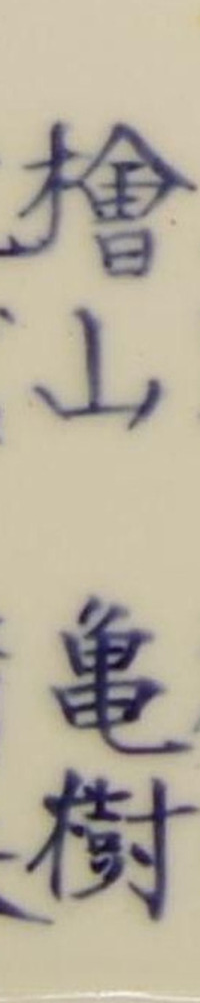檜山亀樹
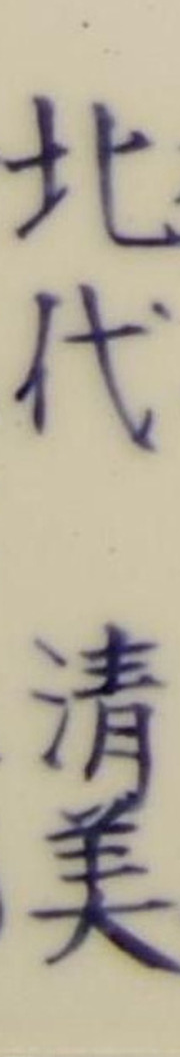北代清美
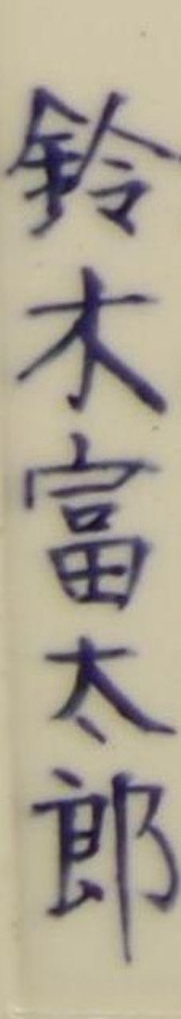鈴木富太郎

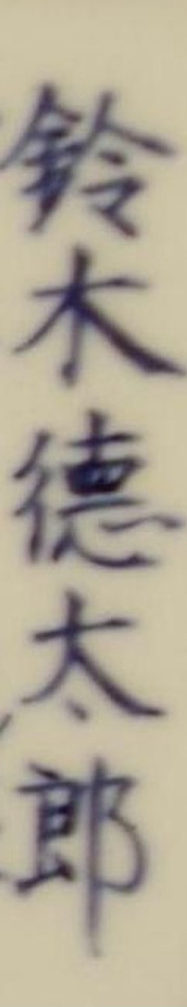鈴木徳太郎
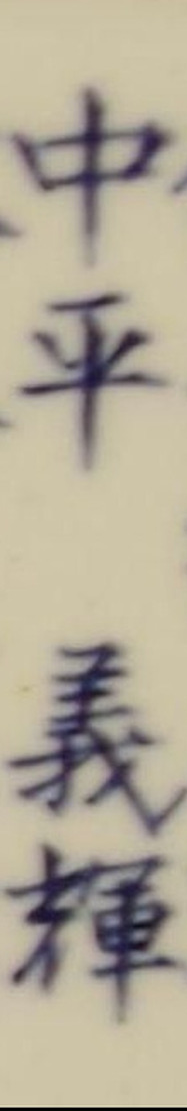中平義輝
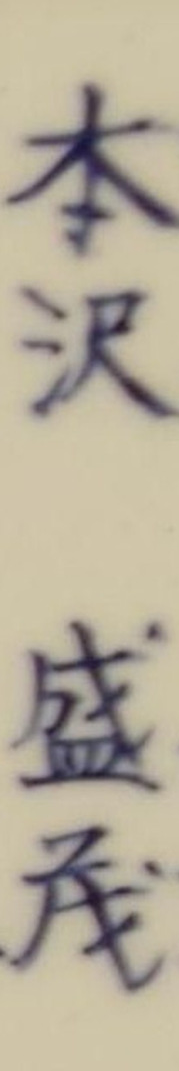本沢盛茂
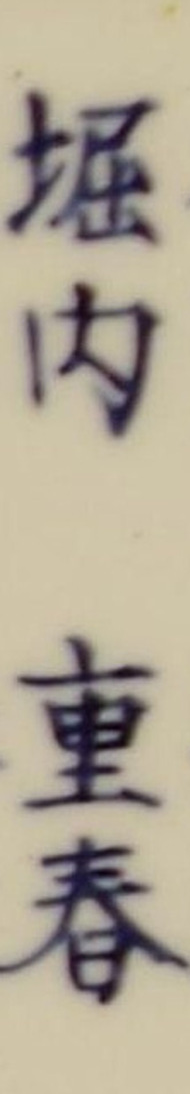堀内重春
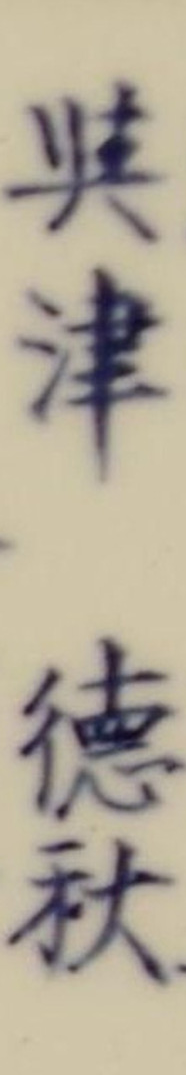興津徳秋
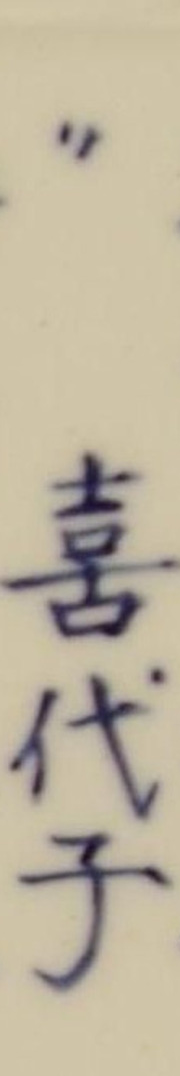喜代子
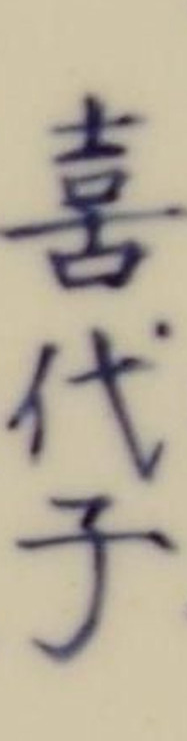喜代子
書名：E~L
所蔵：高野山金剛峯寺
